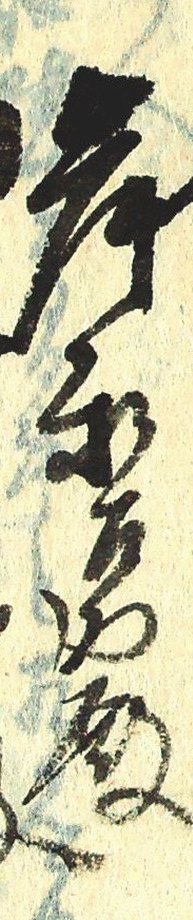岸和左衛門殿
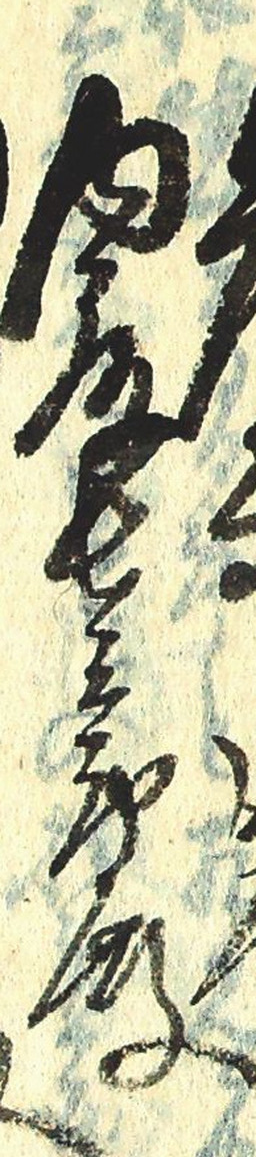内藤長三郎殿
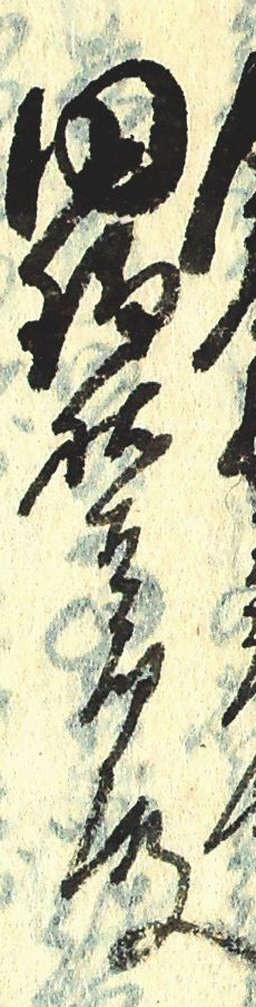田野祐太郎殿

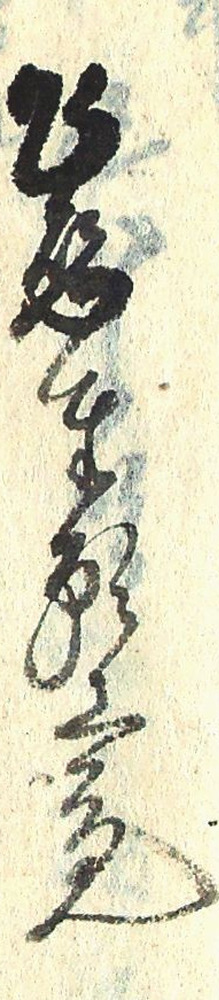乍恐奉願上覚
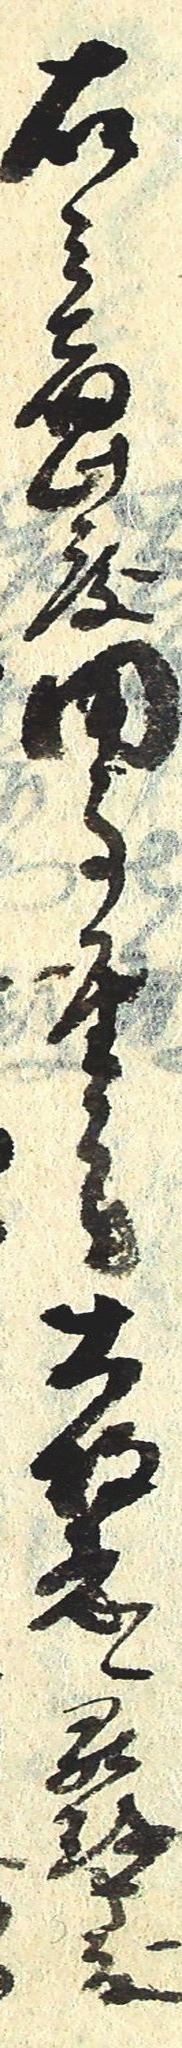右之者此度用事御座候に付大坂表へ罷越申度
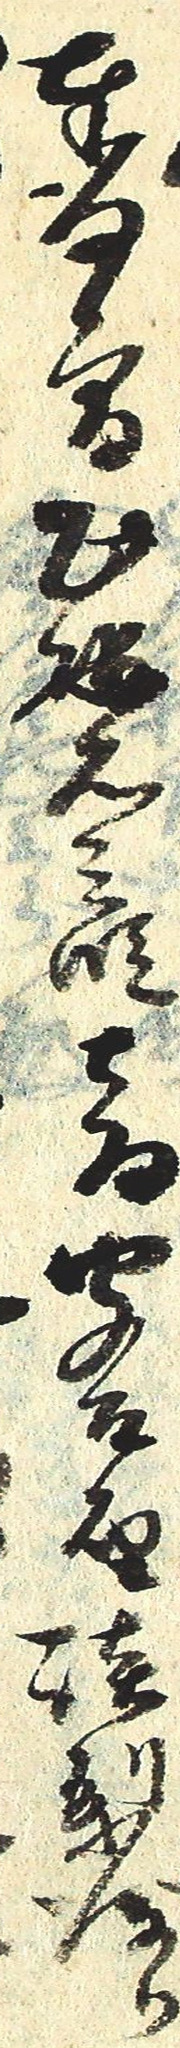奉存候間乍恐右之段被為聞召届淡州小渡り
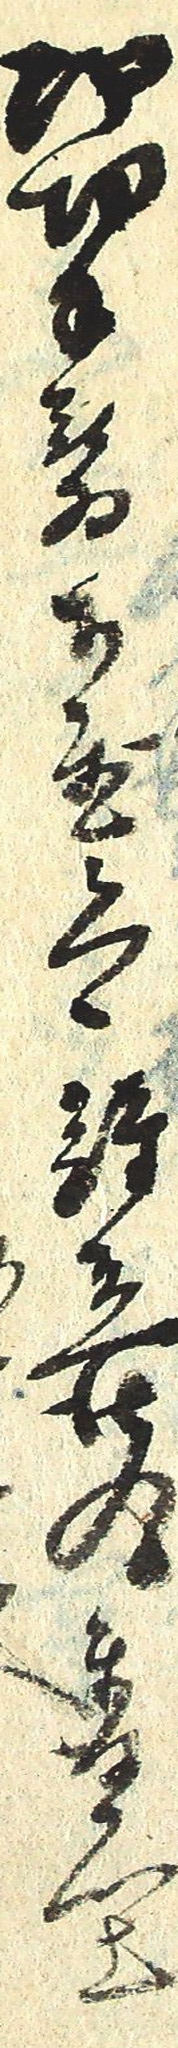御切手被為下置候はゝ難有仕合奉存候以上
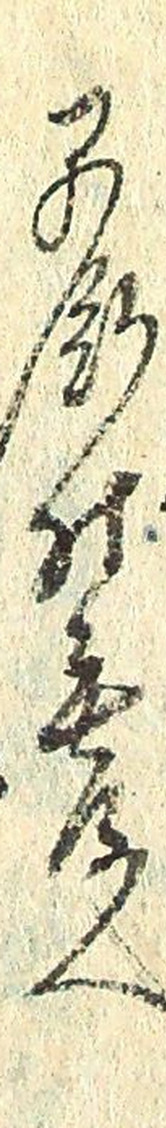早淵村無役人
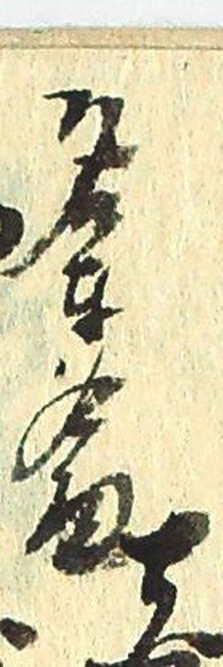名東名西
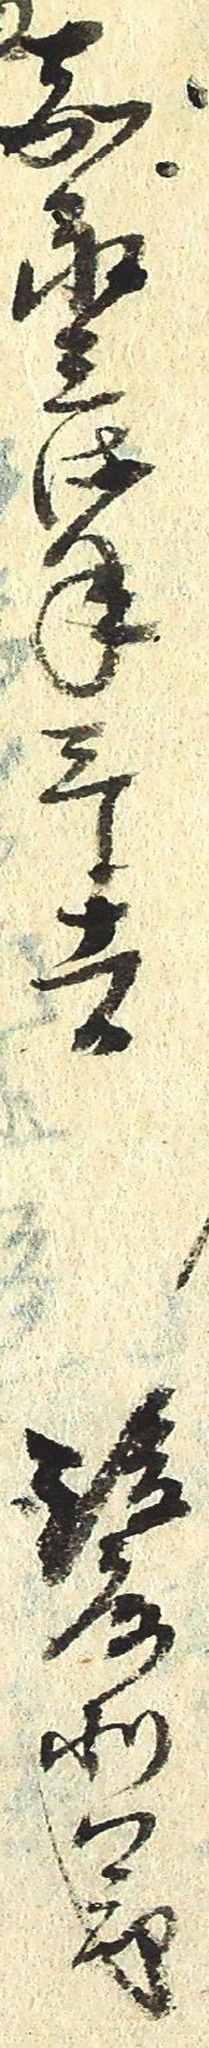嘉永三戌年三月十一日後藤利八郎
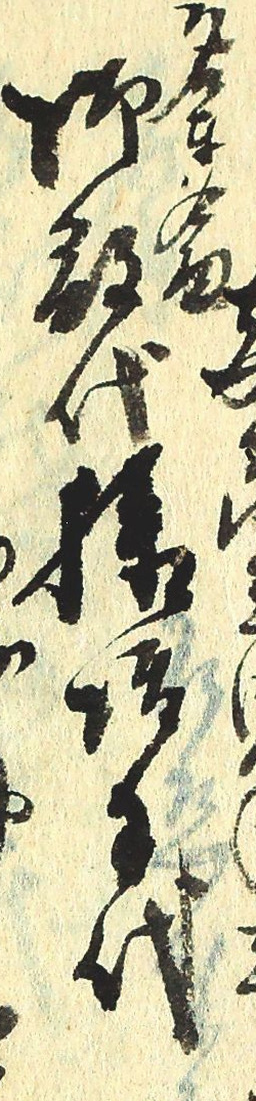御郡代様御手代
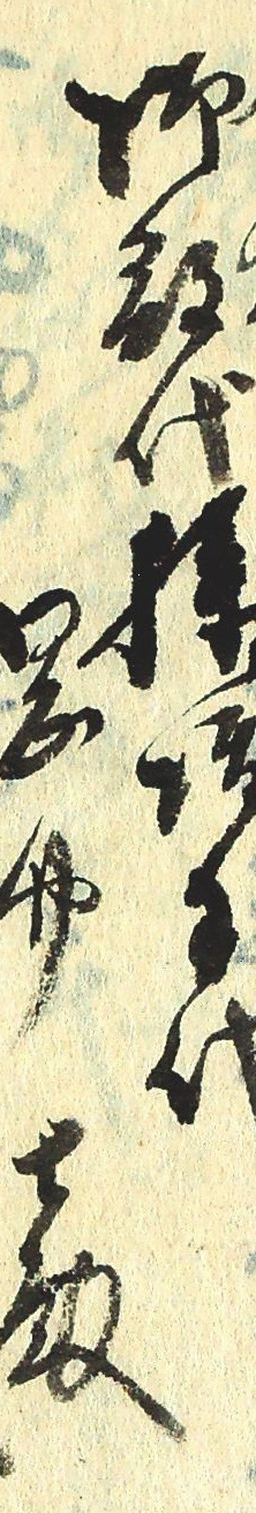岡竹七殿
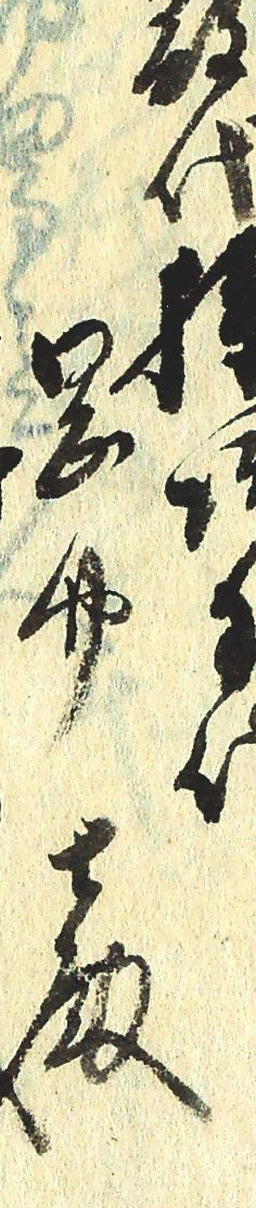岡竹七殿
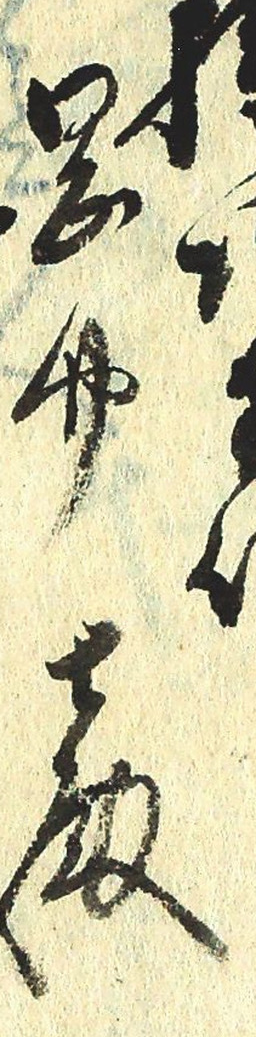岡竹七殿
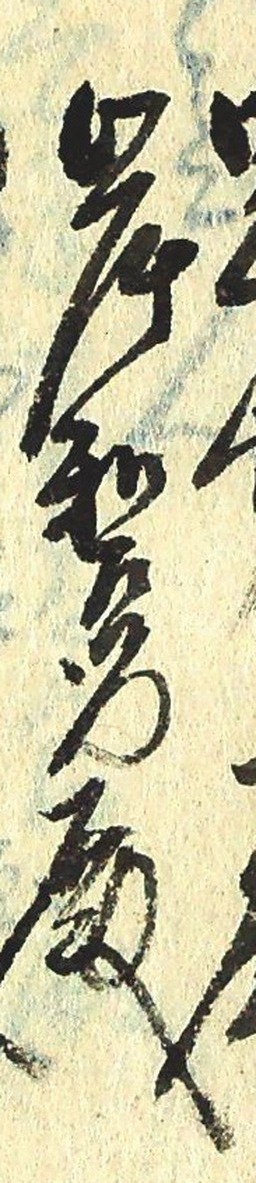岸和左衛門殿
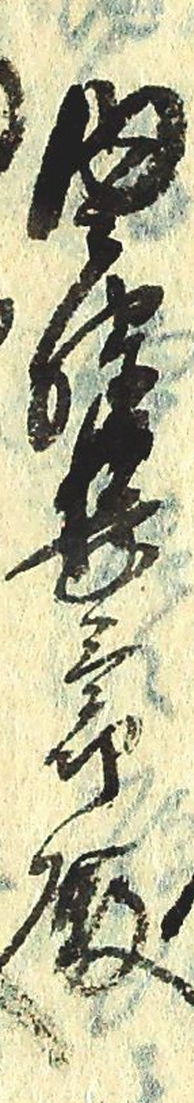内藤長三郎殿
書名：諸御願書控(弐番）
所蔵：鳴門教育大学 Naruto University of Education
